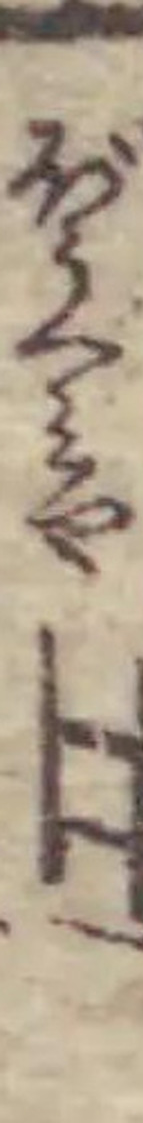ぼうくみや
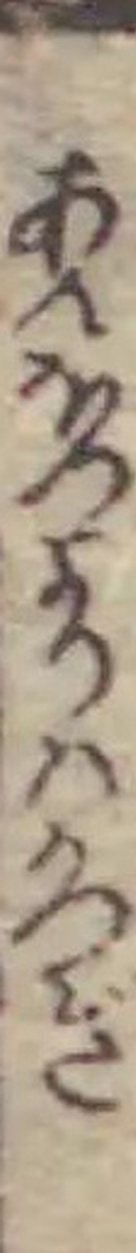あんほつよりはかつぎ
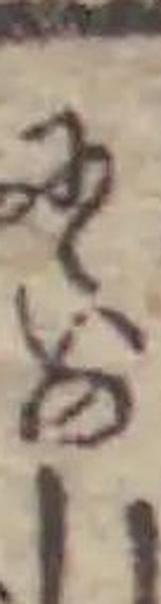にくいの
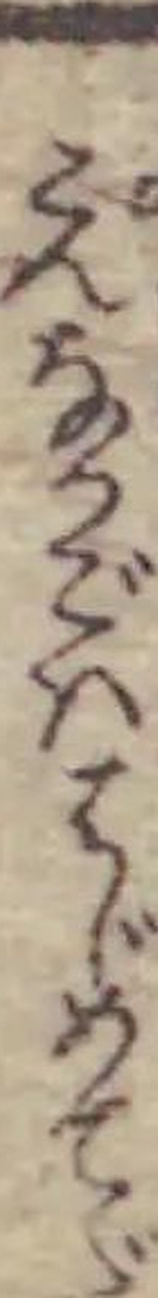こんなかごははじめてだ
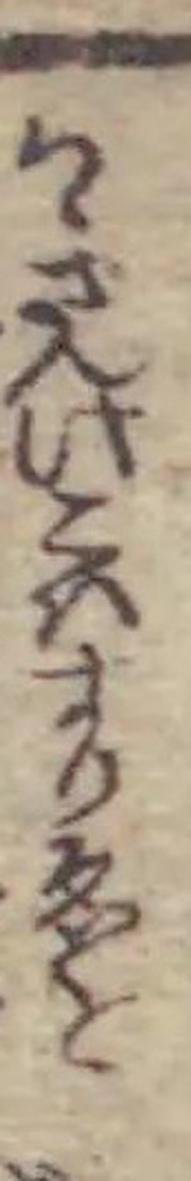かゝさん此こはすりゑを
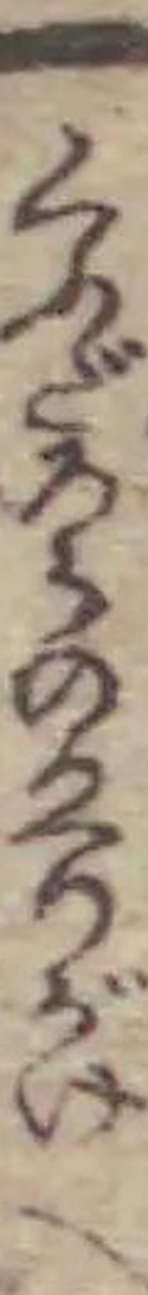くふだろうのかへりがけ
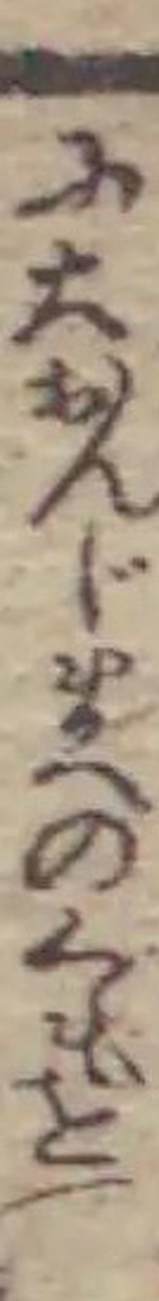に大おんじまへのくもを
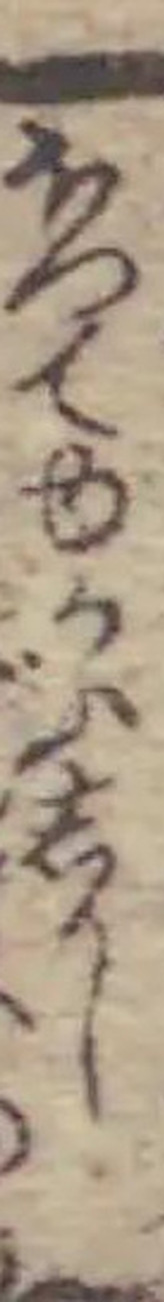ほつてゆかふしかし
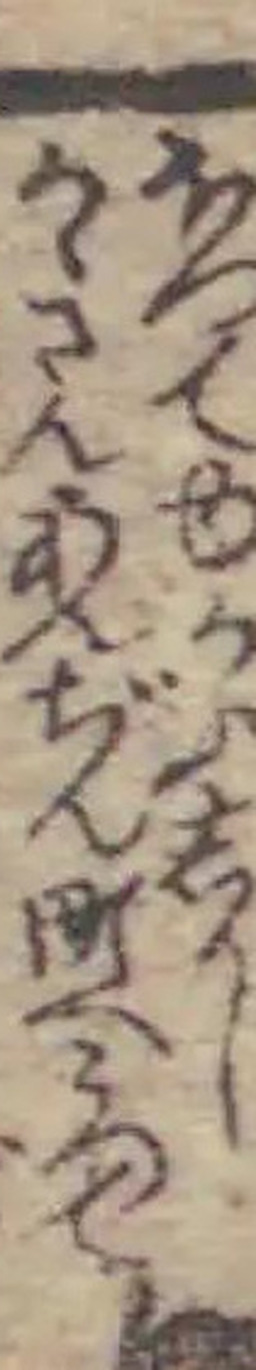かゝさんあんぢん町へうつて
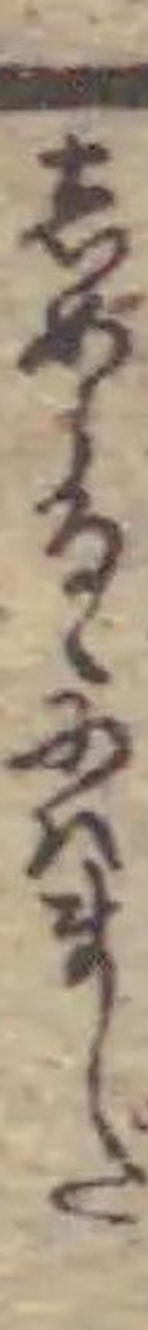しめらるゝにはましだ

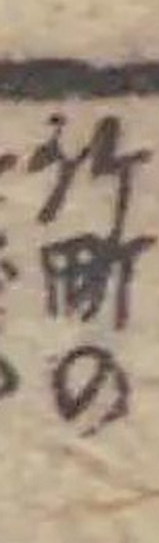竹町の
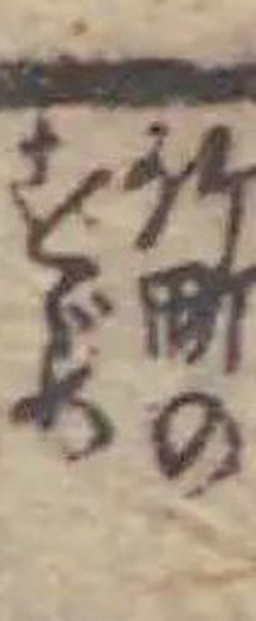すゞめ
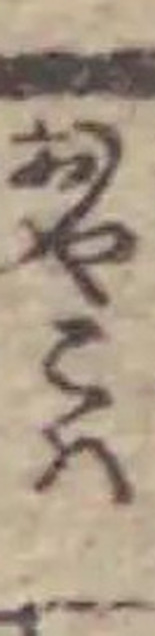おやこは
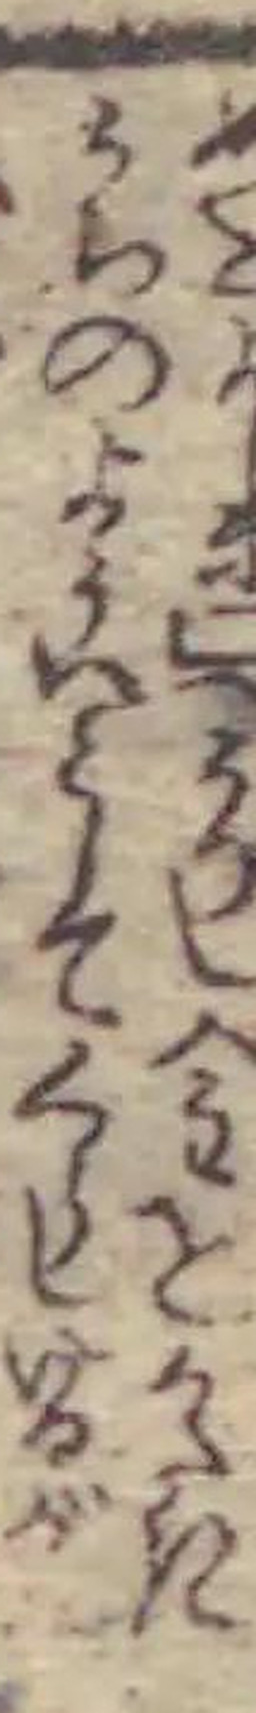うちのよういとしてくらしけるが
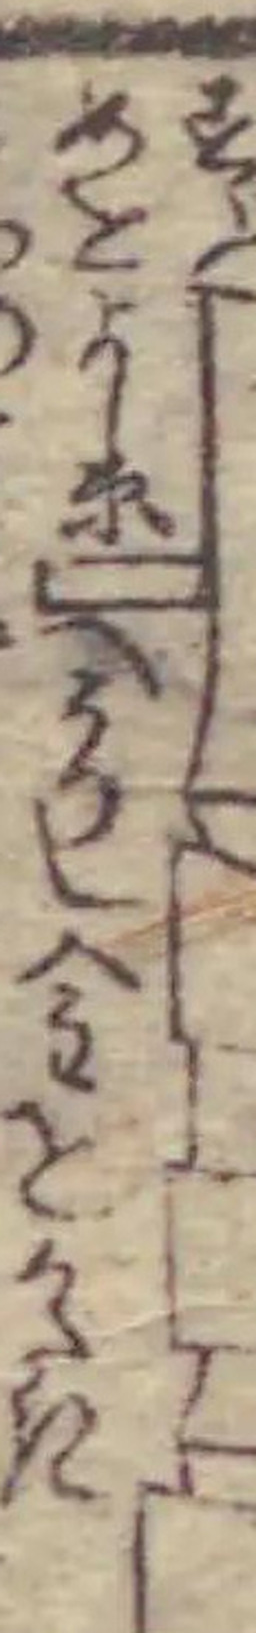めをよし原へうりし金をかたき
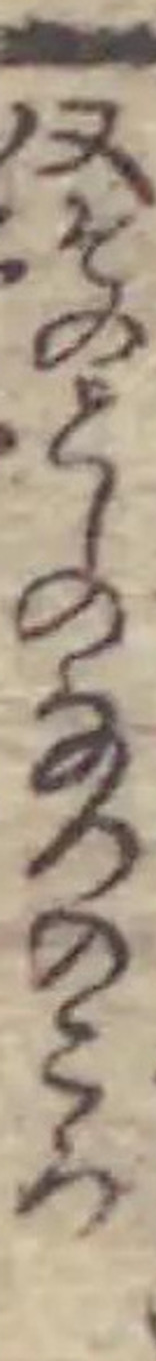又そのとしのなつころ
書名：冷水灰毛猫 2巻
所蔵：国立国会図書館 National Diet Library, JAPAN
